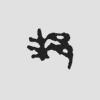邦
